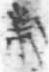旆
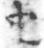屯
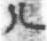八
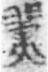翼
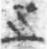之
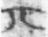亓（其）
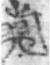○（旗）
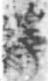○（翠）
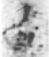首
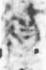紫
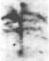羊
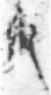須
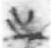之
